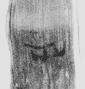四
